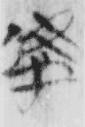○（甲）
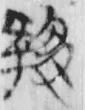執
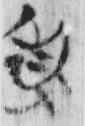事
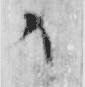人
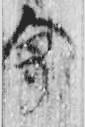○（邑）
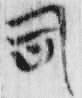司
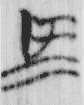馬
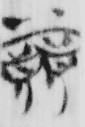競
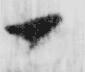丁
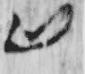㠯（以）
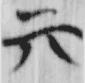亓（其）
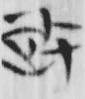政
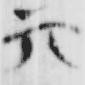亓（其）
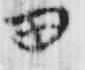田
